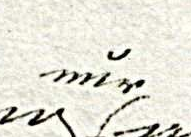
nur
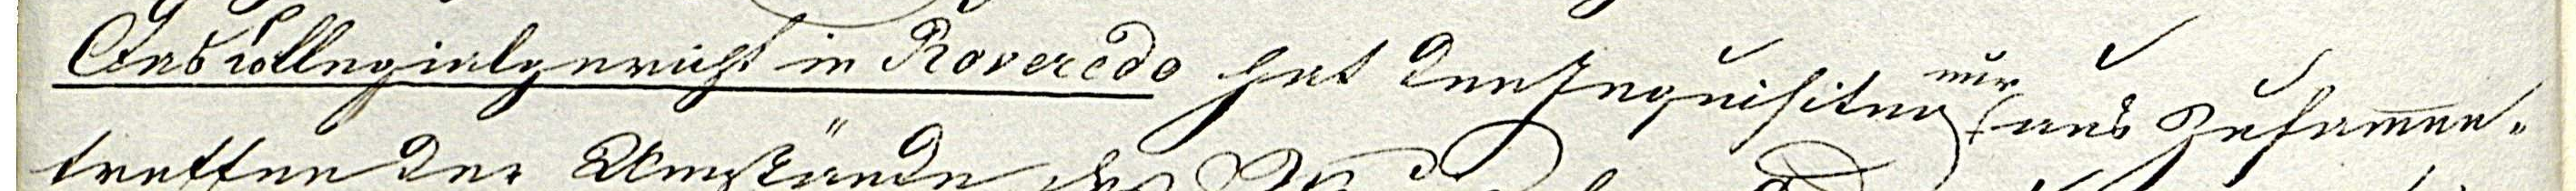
Das Collegialgericht in Roveredo hat den Jnquisiten aus Zusammen¬
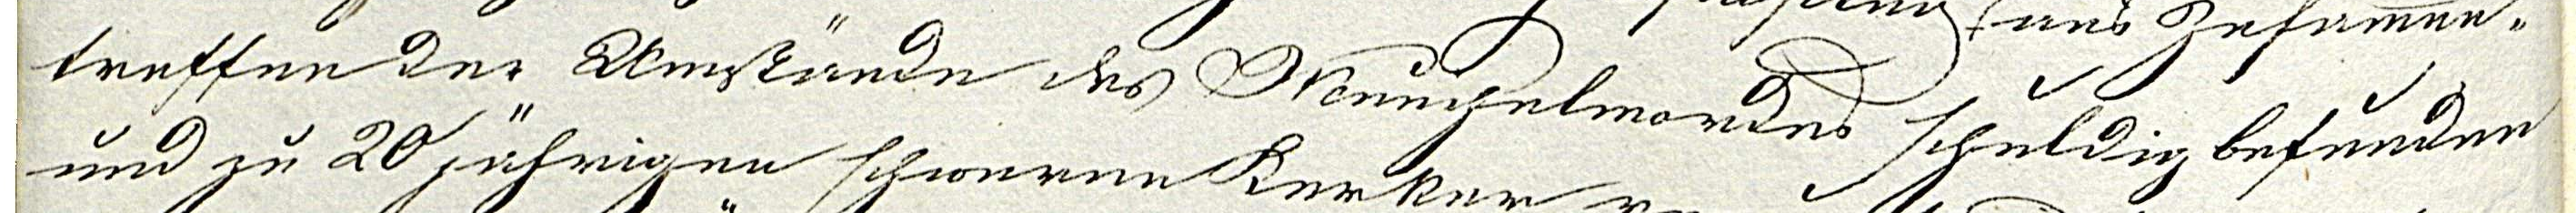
treffen der Umstände des Meuchelmordes schuldig befunde
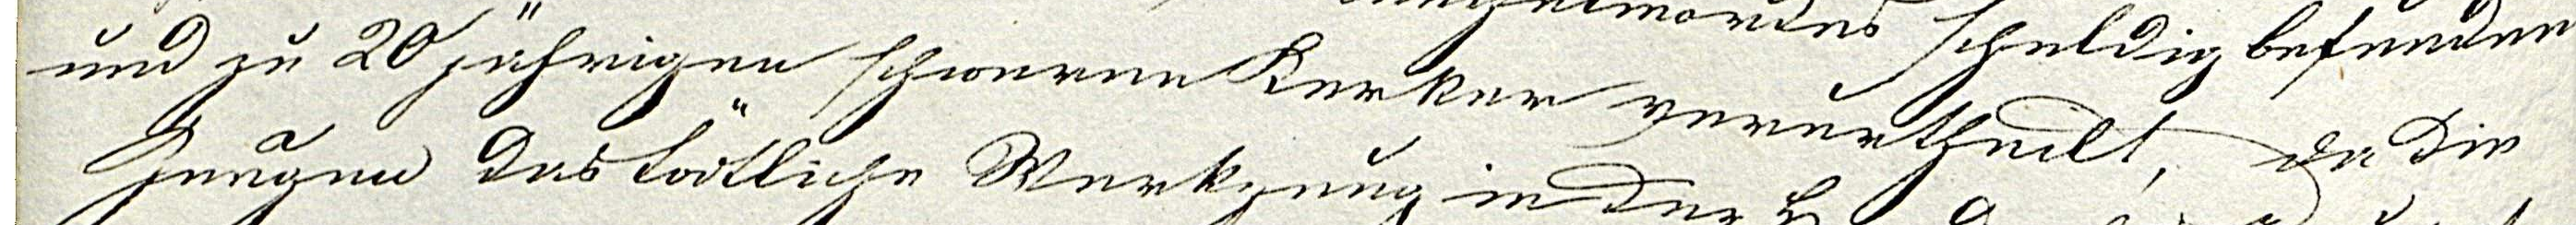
und zu 20 jährigen schweren Kerker verurtheilt, da die
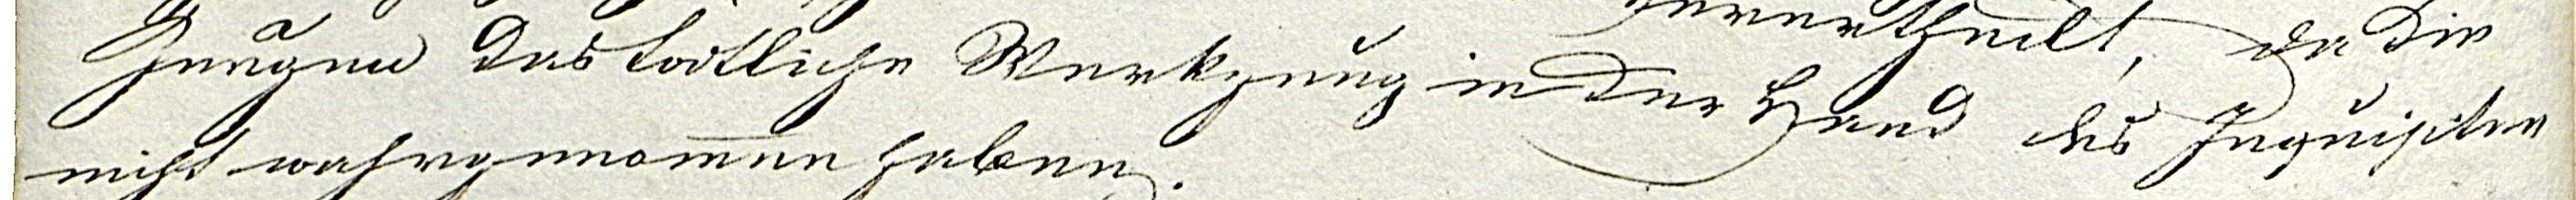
Zeugen das tödtliche Werkzeug in der Hand des Jnquisiten
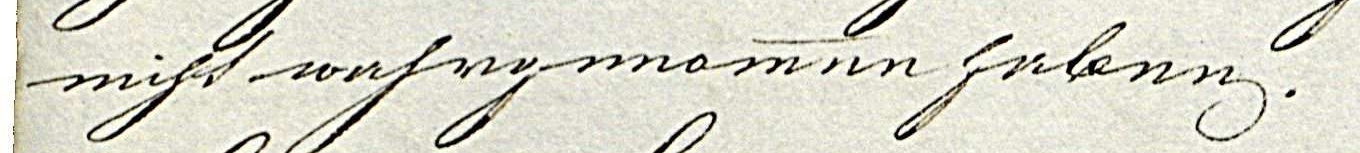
nicht wahrgenommen haben.
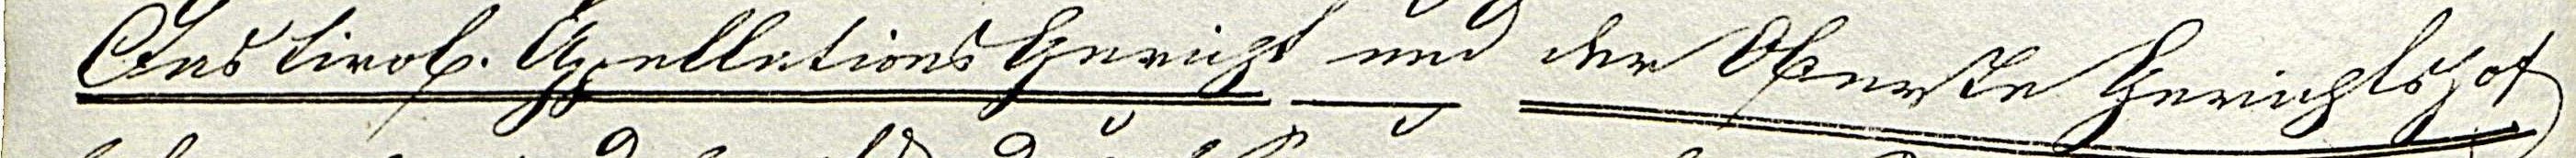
Das tirol. Appellations Gericht und der Oberste Gerichtshof
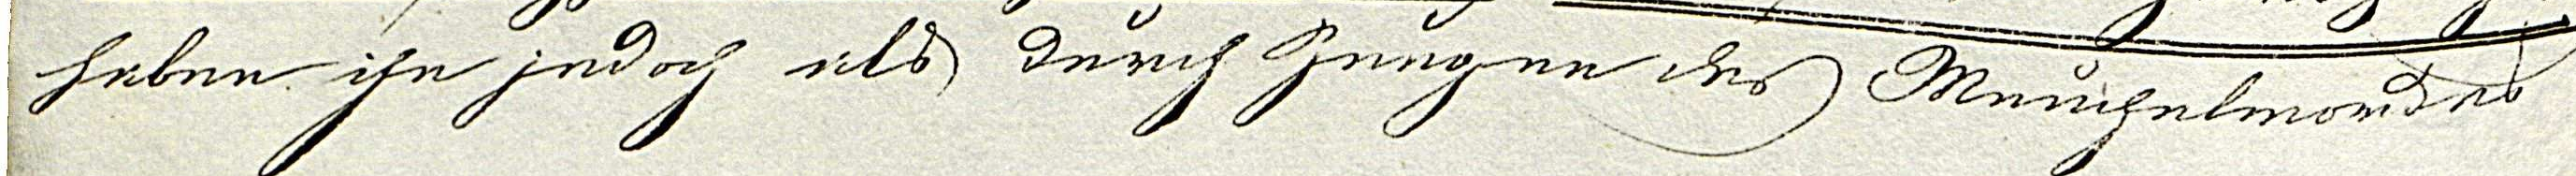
haben ihn jedoch als durch Zeugen des Meuchelmordes
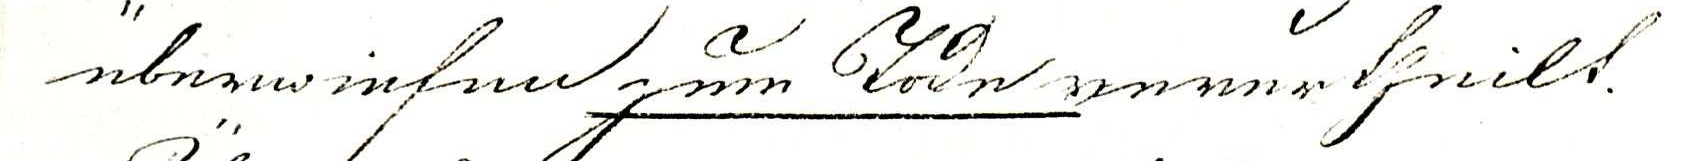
überwiesen zum Tode verurtheilt.
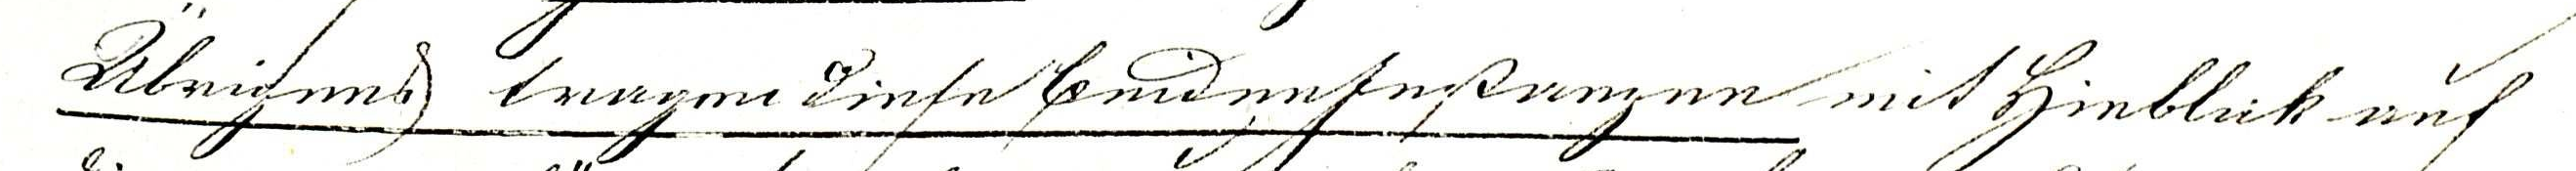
Übrigens tragen diese bei den Jnstanzen mit Hinblick auf
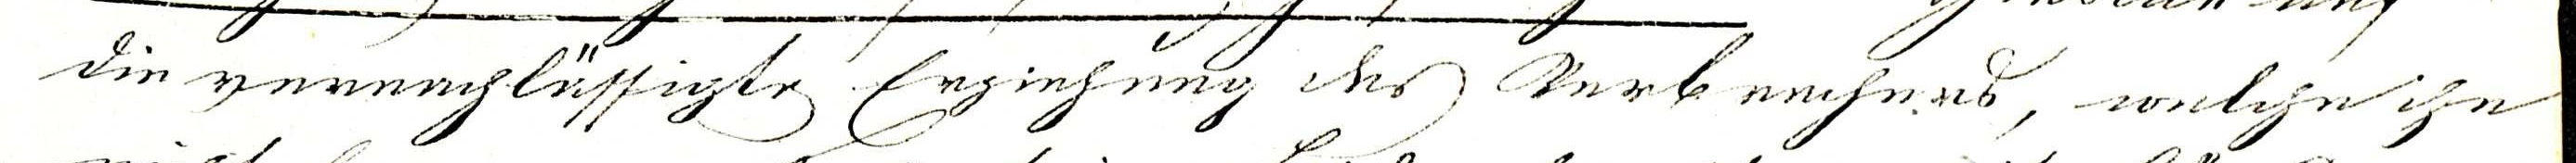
die vernachlässigte Erziehung das Verbrechers, welche ihn
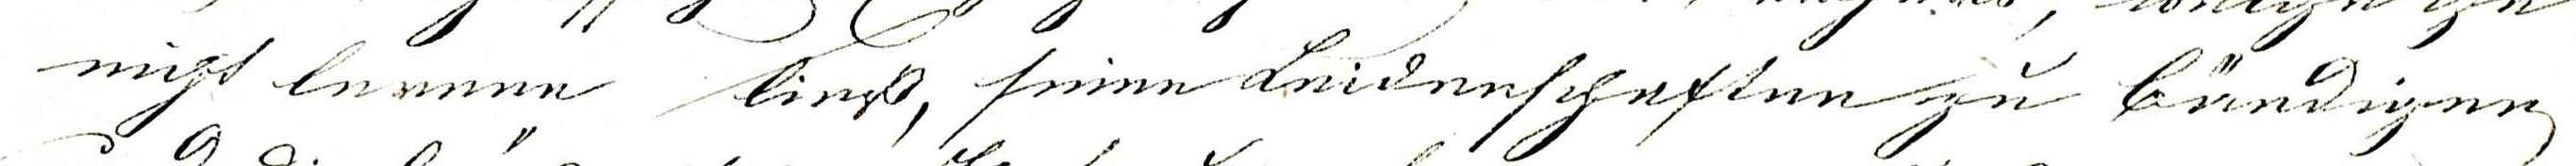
nicht lernen ließ, seine Leidenschaften zu bändigen
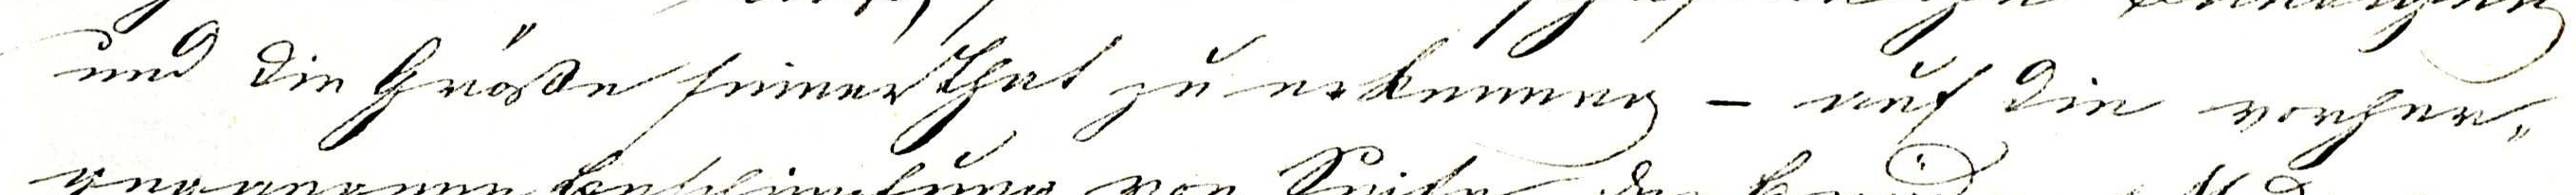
und die Größe seiner That zu erkennen - auf die vorher¬
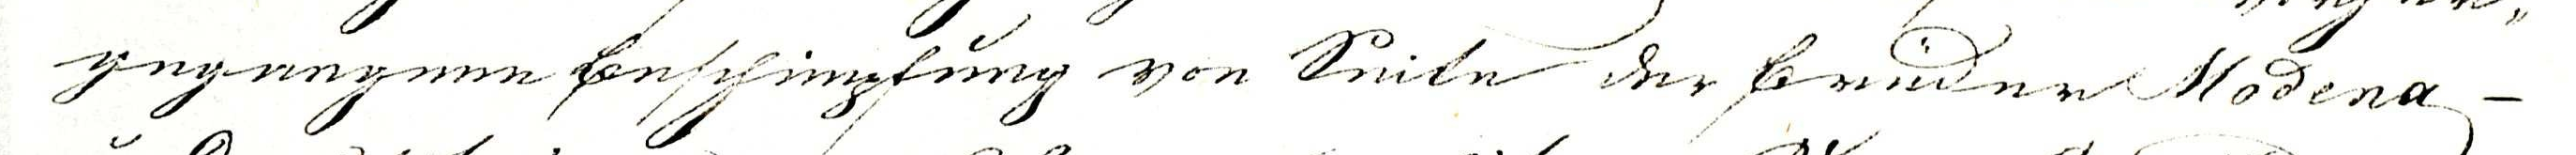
gegangene Beschimpfung von Seite der Brüder Modena -
